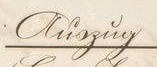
Auszug
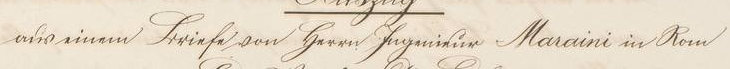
aus einem Briefe von Herrn Ingenieur Maraini in Rom
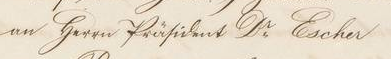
an Herrn Präsident Dr Escher
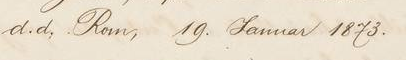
d. d. Rom, 19. Januar 1873.
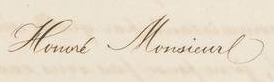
Honoré Monsieur
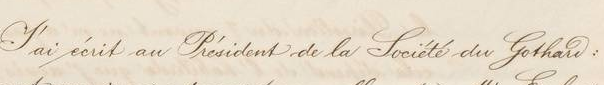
J'ai écrit au Président de la Société du Gothard:
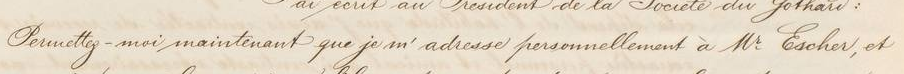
Permettez-moi maintenant que je m'adresse personnellement à Mr Escher, et
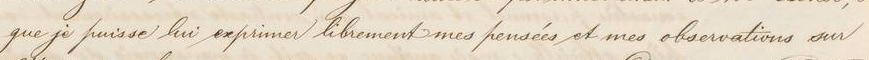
que je puisse lui exprimer librement mes pensées et mes observations sur
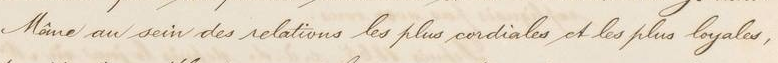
Même au sein des relations les plus cordiales et les plus loyales,
